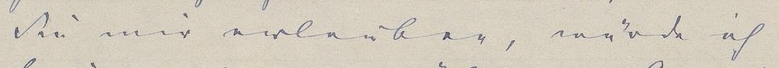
Sie mir erlauben, würde ich
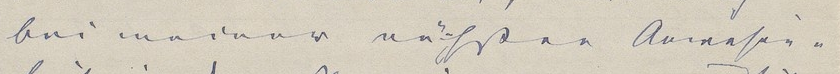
bei meiner nächsten Anwesen-
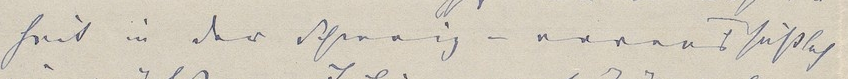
heit in der Schweiz – voraussichtlich
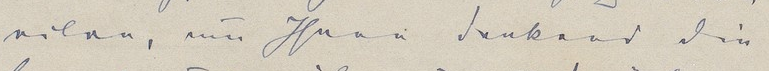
eilen, um Ihnen dankend die
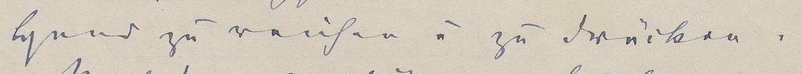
Hand zu reichen u zu drücken.
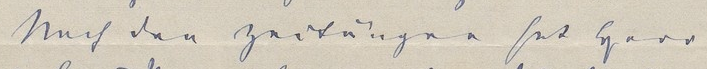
Nach den Zeitungen hat Herr
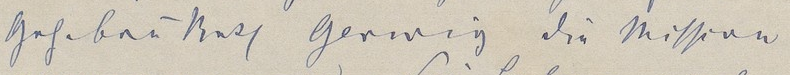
Geh. Baurath Gerwig die Mission
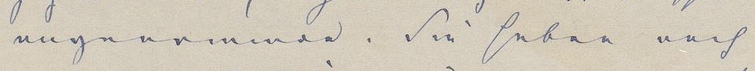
angenommen. Sie haben nach
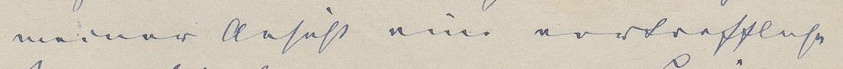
meiner Ansicht eine vortreffliche
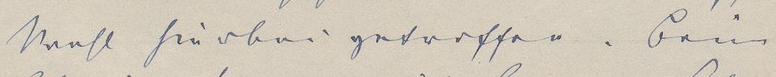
Wahl hierbei getroffen. Beim
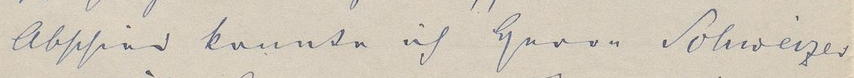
Abschied konnte ich Herrn Schweizer
